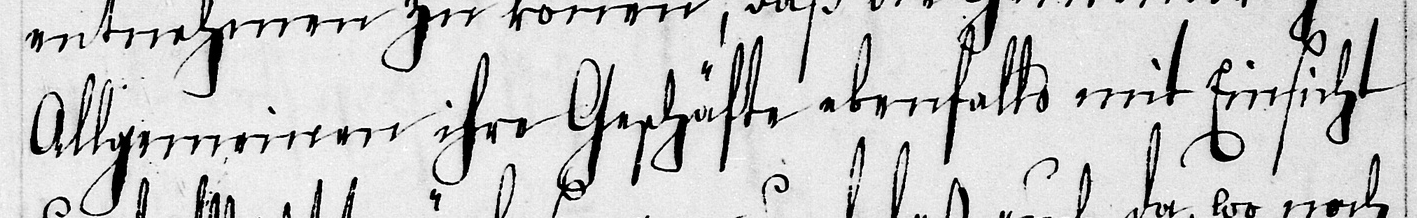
Allgemeinen ihre Geschäfte ebenfalls mit Einsicht
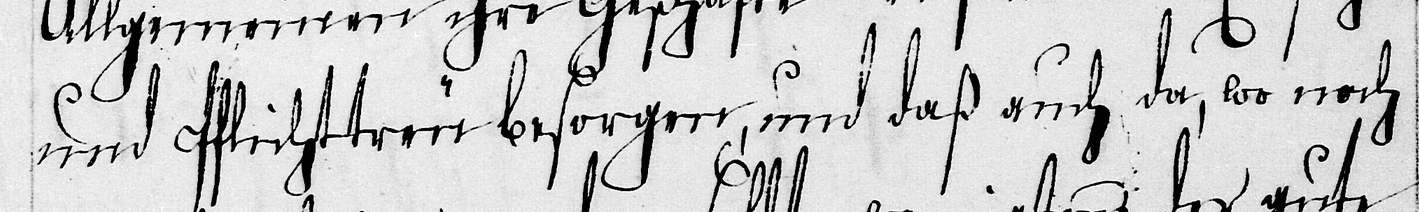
und Pflichttreu besorgen, und daß auch da, wo noch
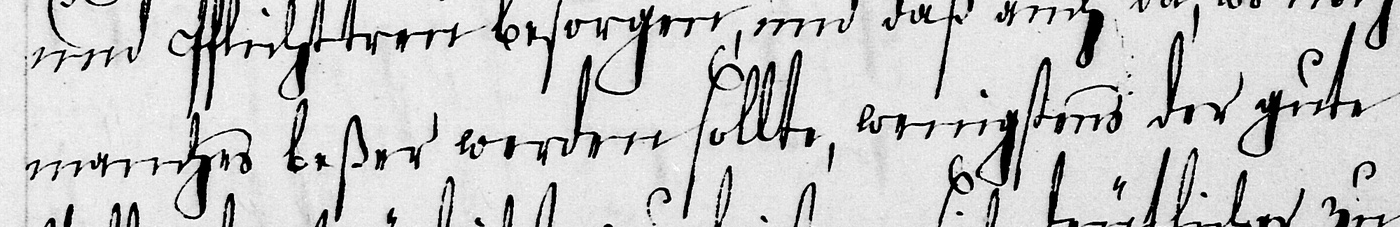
manches beßer werden sollte, wenigstens der gute
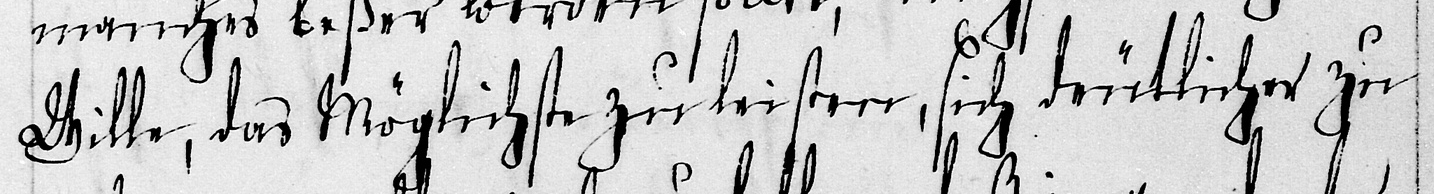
Wille, das Möglichste zu leisten, sich deutlicher zu
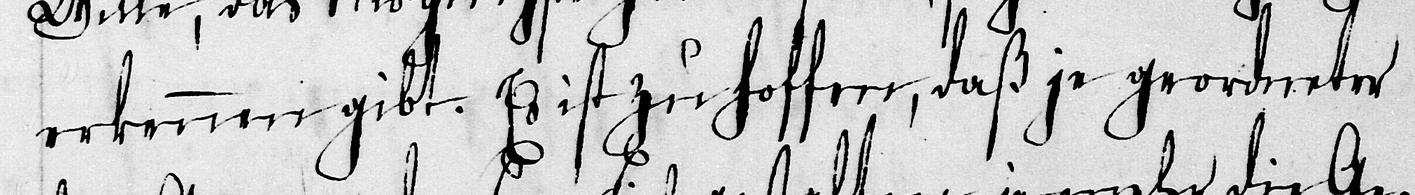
erkennen gibt. Es ist zu hoffen, daß je geordneter
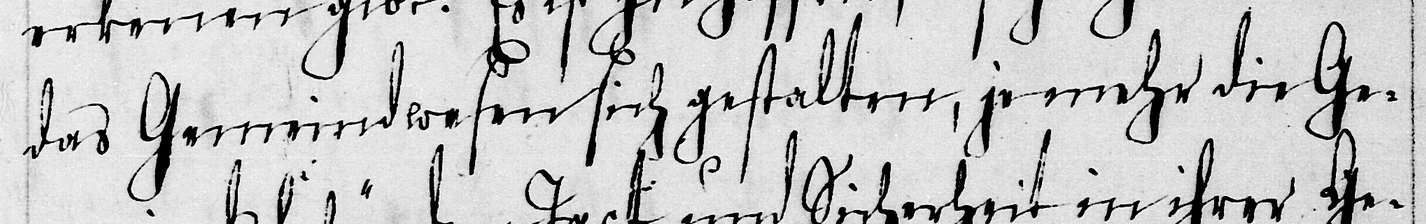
das Gemeindwesen sich gestatten, ja mehr die Ge¬
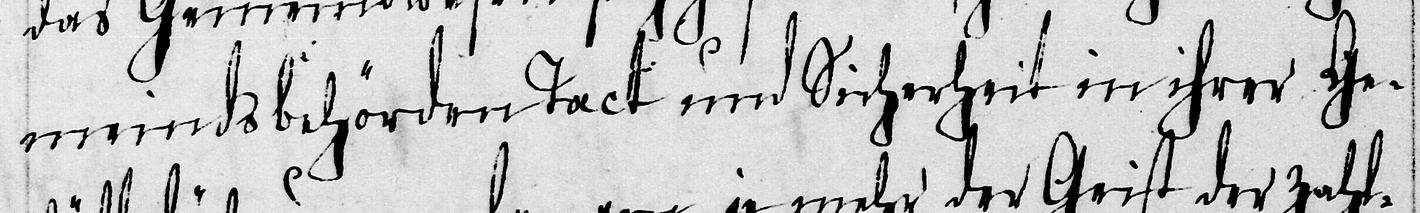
meindsbehörden Tact und Sicherheit in ihrer Ge¬
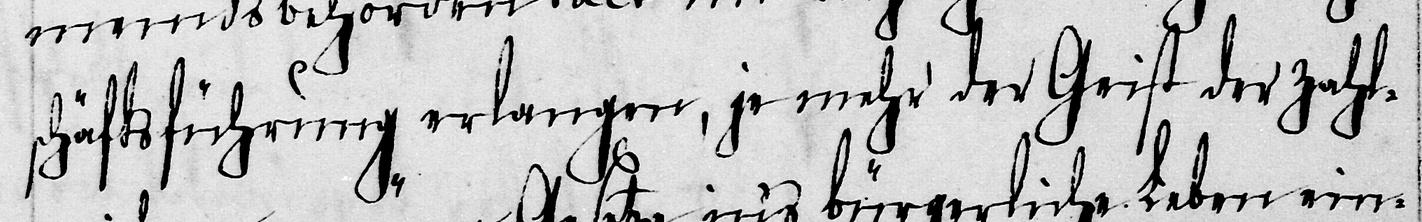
schäftsführung erlangen, je mehr der Geist der zahl¬
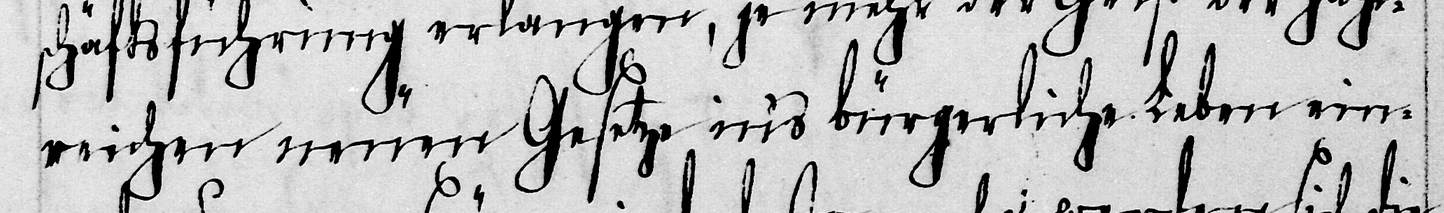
reichen neuen Gesetze in’s bürgerliche Leben ein¬
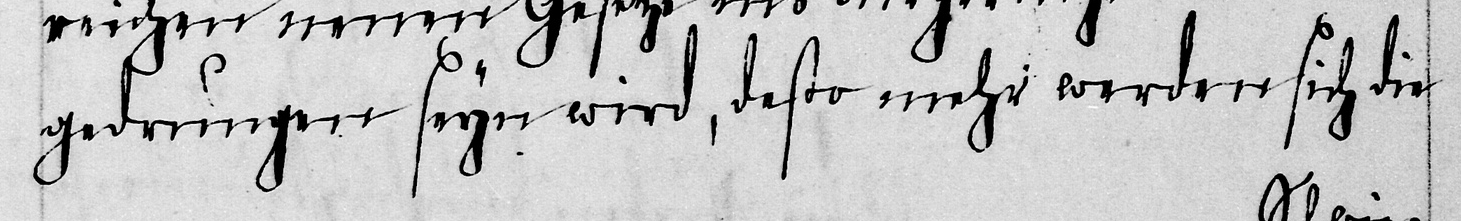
gedrungen seyn wird, desto mehr werden sich die
